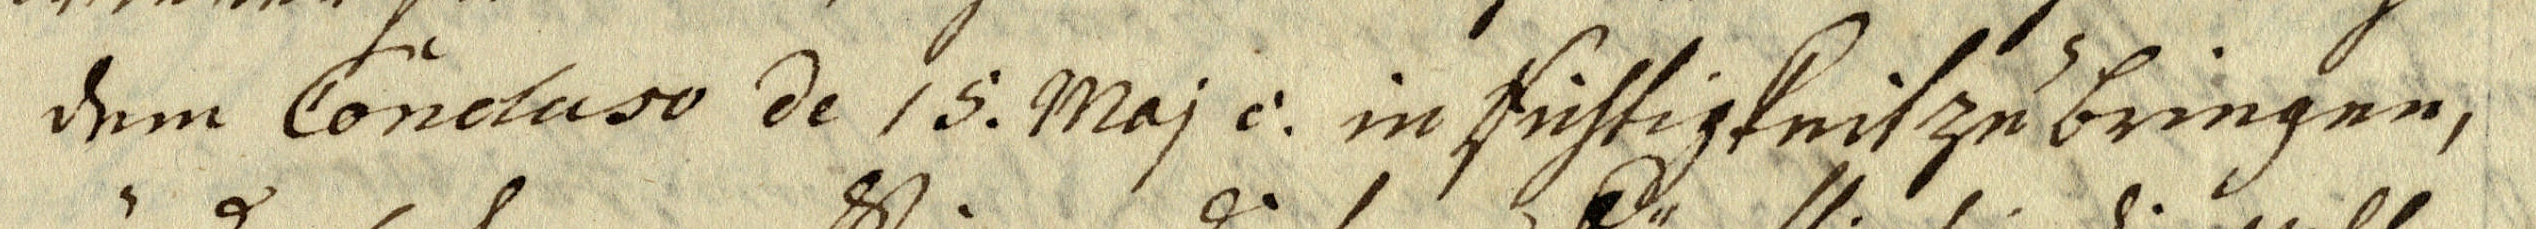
dem Concluso de 15. Maj e. in Richtigkeit zu bringen,
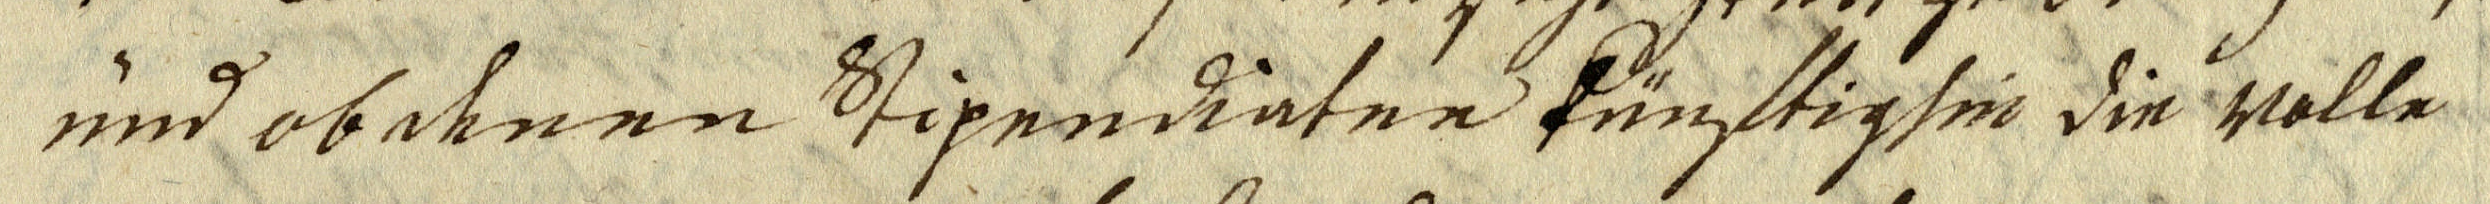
und ob denen Stipendiaten künftighin die volle
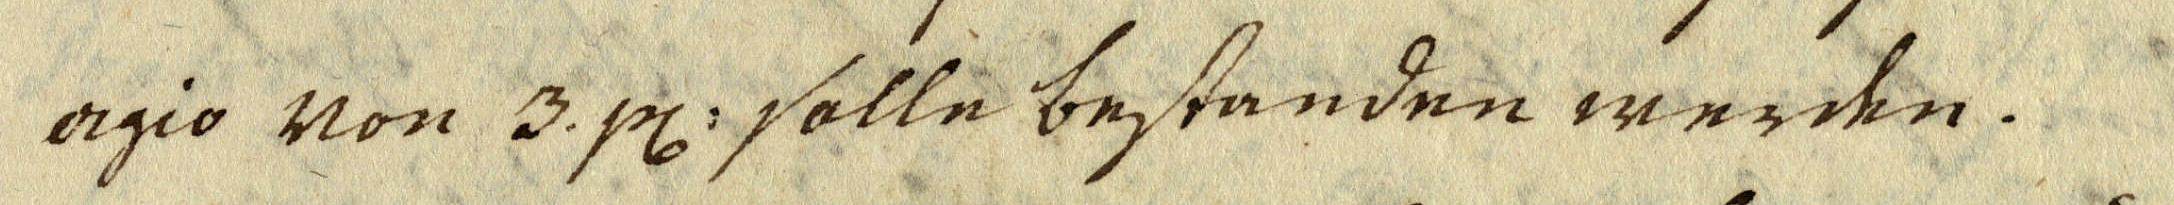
agio von 3. p. solle bestanden werden.
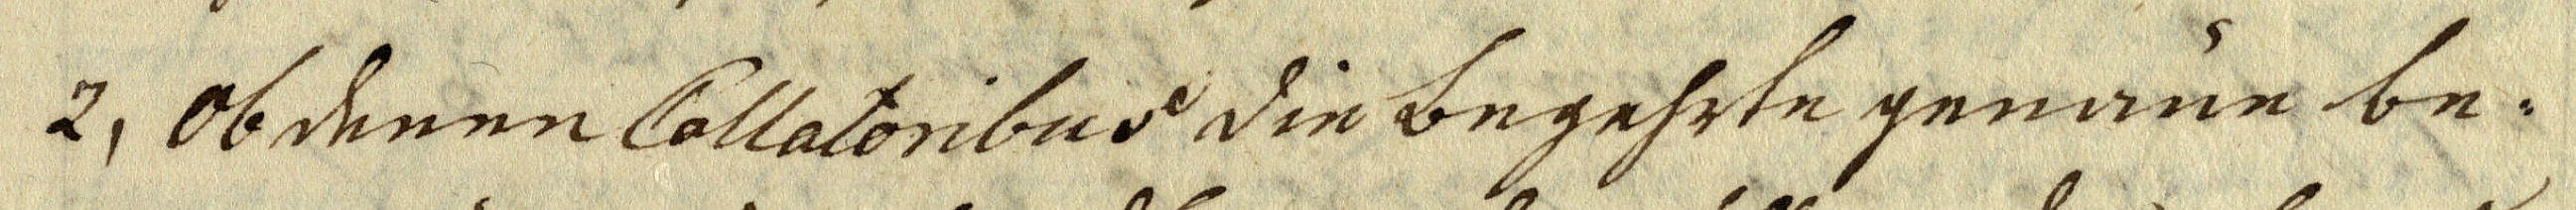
2, ob denen Collatoribus die begehrte genaue Be¬
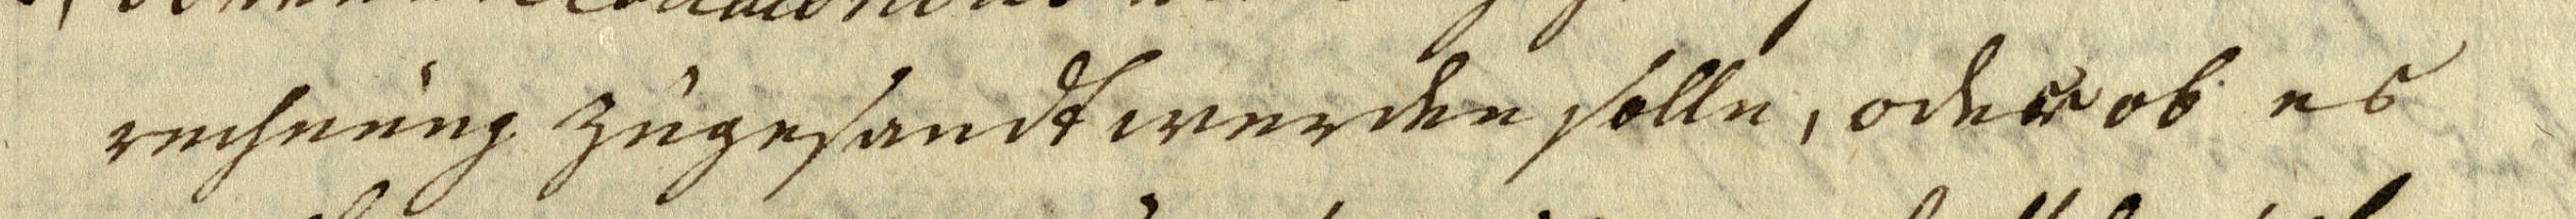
rechnung zugesandt werden solte, oder ob es
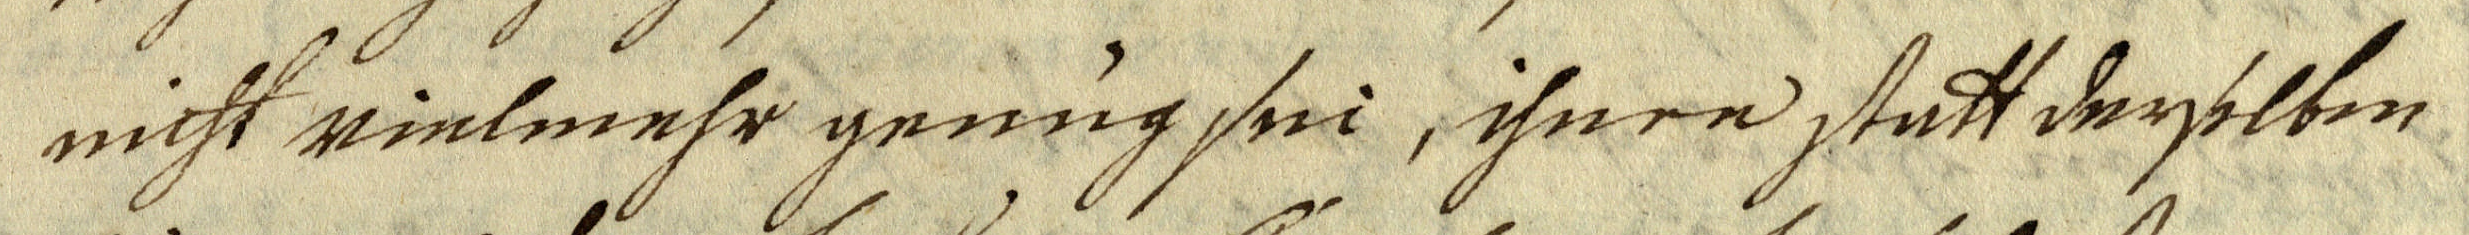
nicht vielmehr genug sei, ihnen statt derselben
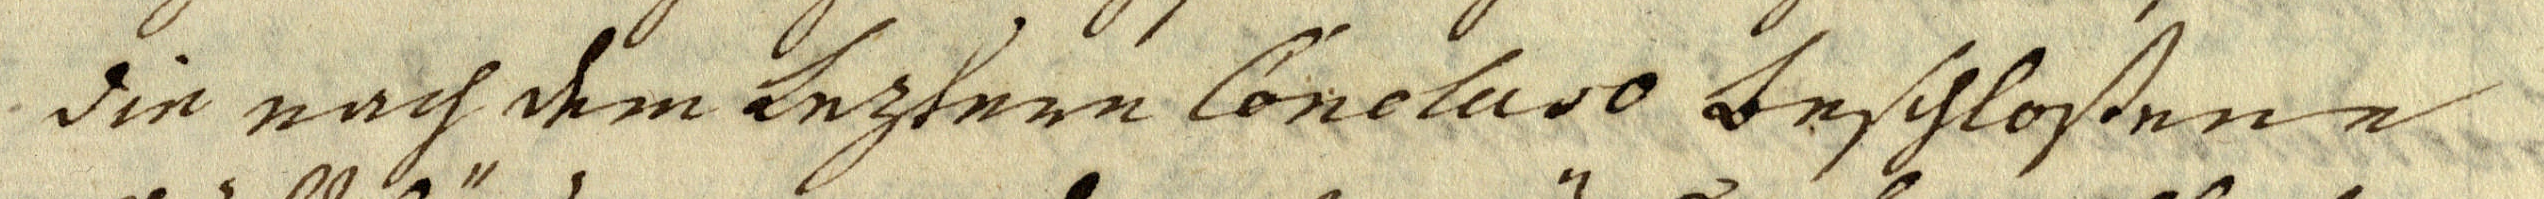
die nach dem leztere Concluso beschloßene
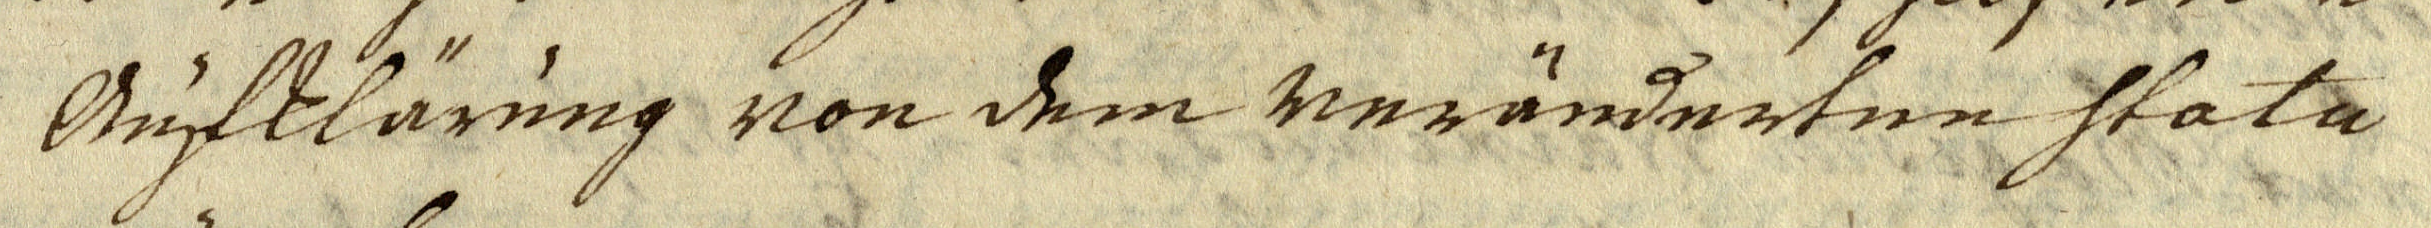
Aufklärung von dem veränderten statu
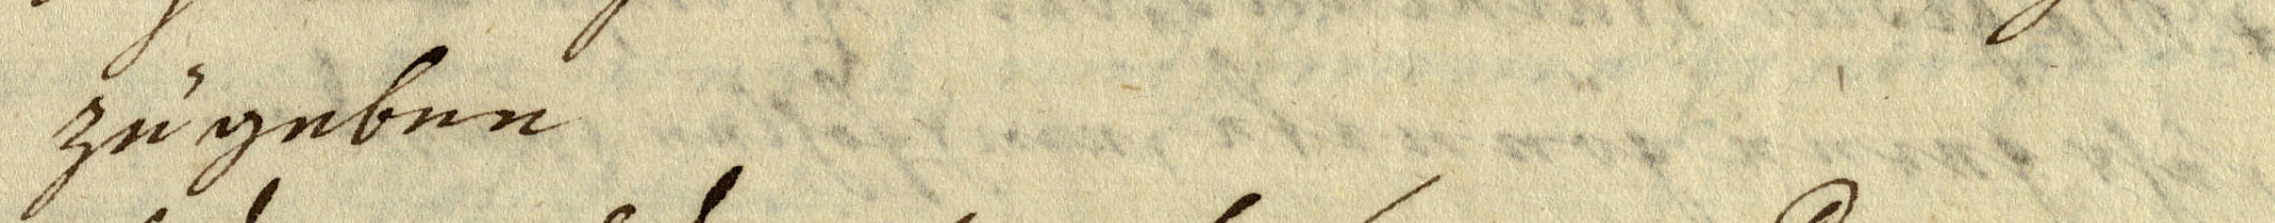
zu geben.
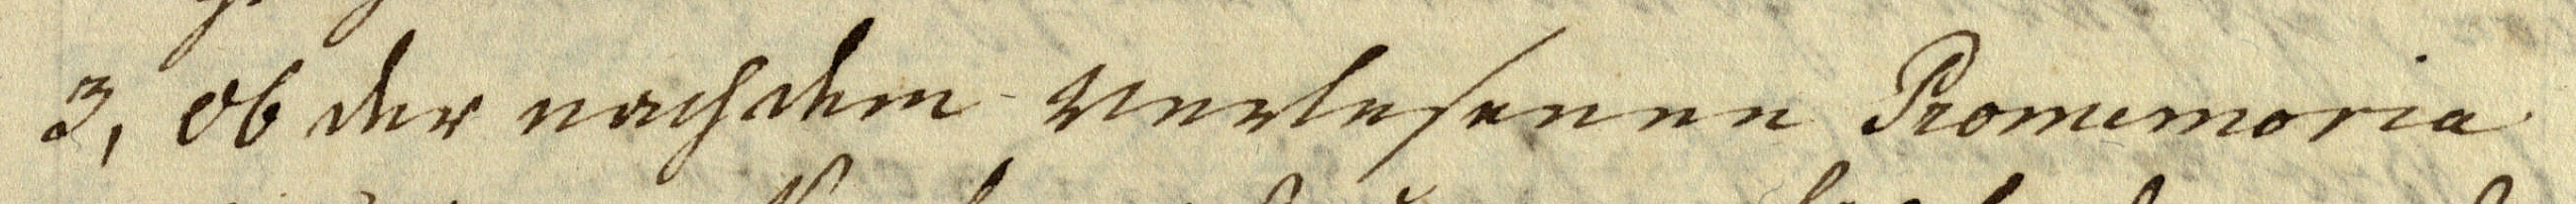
3, ob der nachdem verlesenen Promemoria
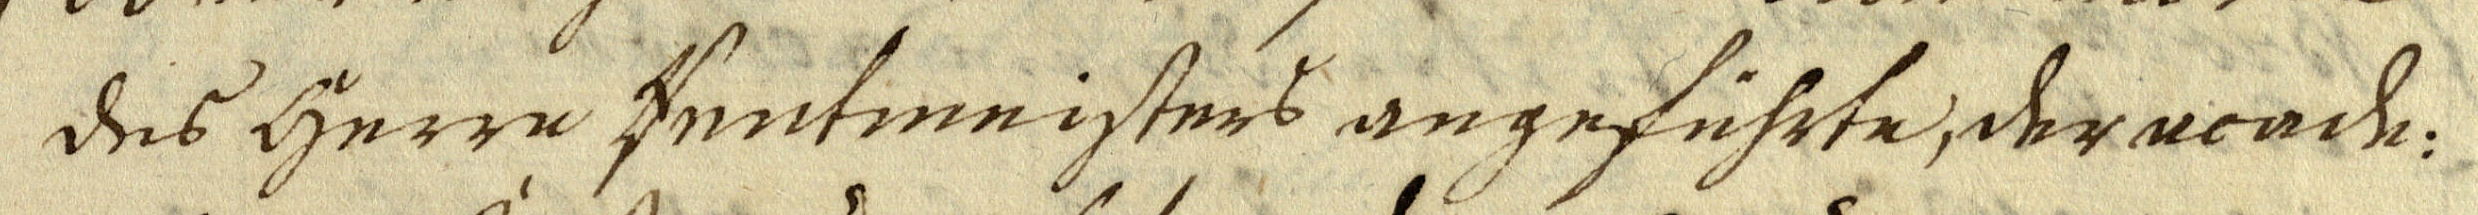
des Herrn Rentmeisters angeführte, der acade¬
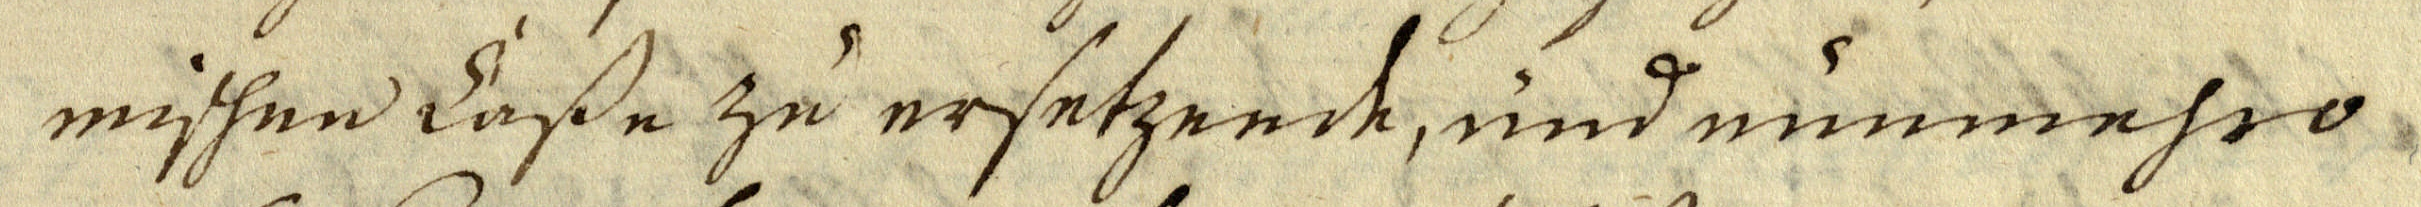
mischen Caße zu ersetzende, und nunmehro
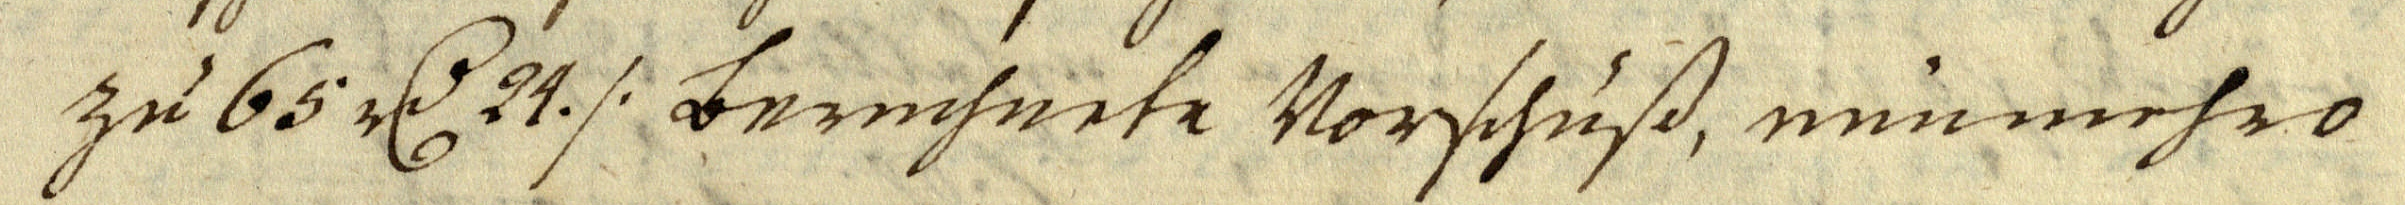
zu 65 r. 24. s. berechnete Vorschuß, nunmehro
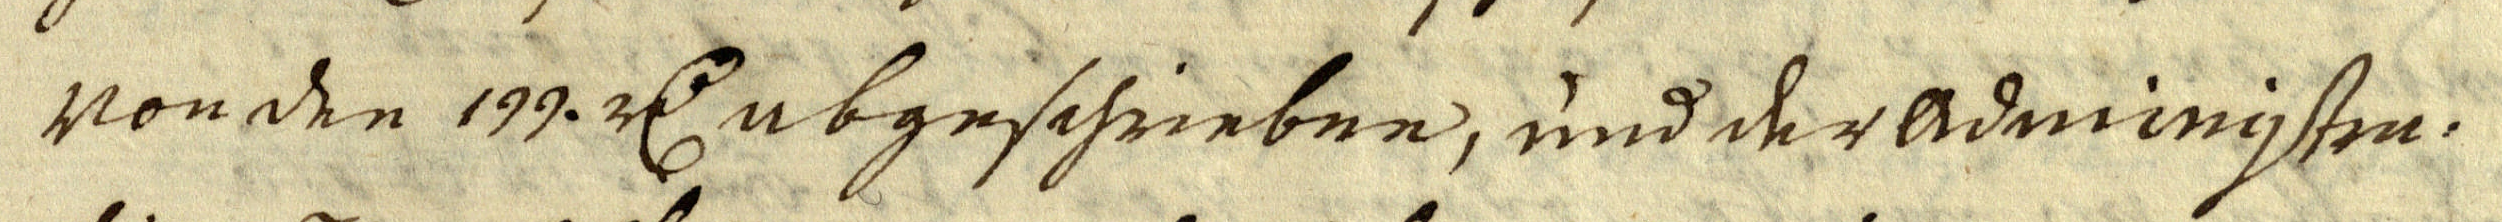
von den 199 r. abgeschrieben, und der Administra¬
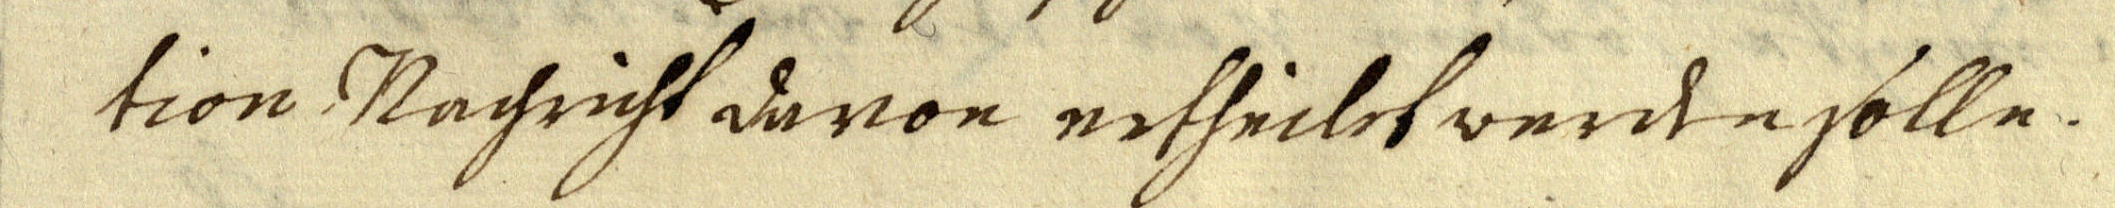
tion Nachricht davon ertheilet werden solle.
